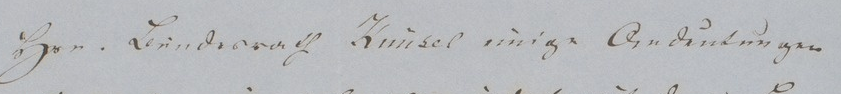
Hrn. Bundesrath Knüsel einige Andeutungen
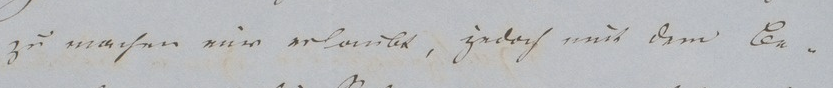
zu machen mir erlaubt, jedoch mit dem Be-
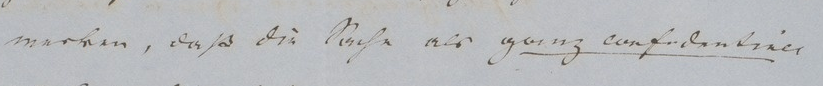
merken, daß die Sache als ganz confidentiell
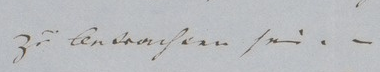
zu betrachten sei. –
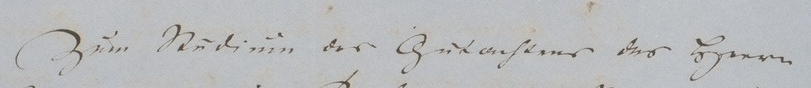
Zum Studium des Gutachtens des Herrn
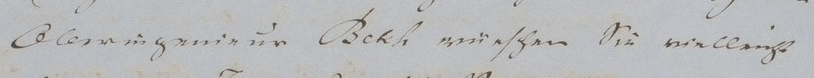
Oberingenieur Bekh wünschen Sie vielleicht
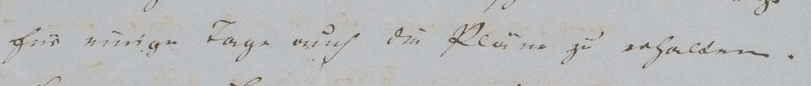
für einige Tage auch die Pläne zu erhalten.
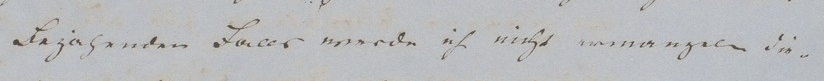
Bejahenden Falls werde ich nicht ermangeln, die-
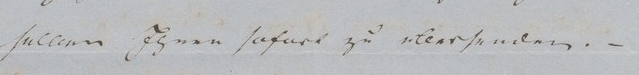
selben Ihnen sofort zu übersenden. –
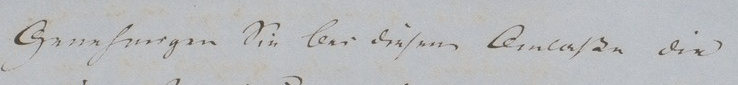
Genehmigen Sie bei diesem Anlaße die
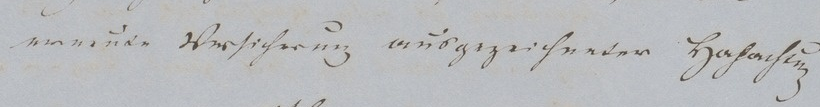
erneute Versicherung ausgezeichneter Hochachtung
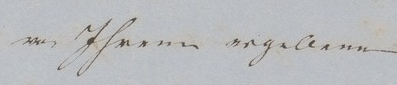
von Ihrem ergebenen
